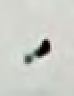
„
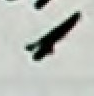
1
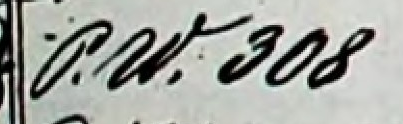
P.W. 308
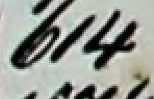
614
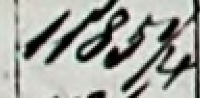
1185 1/4
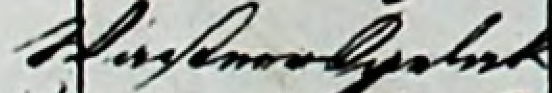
Wastnersgelak
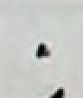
„
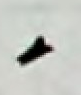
„
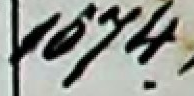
1674
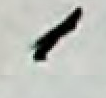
1
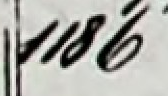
1186
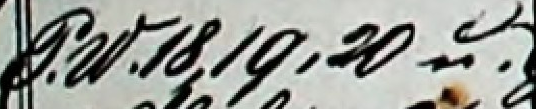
P.W. 18, 19, 20 u.
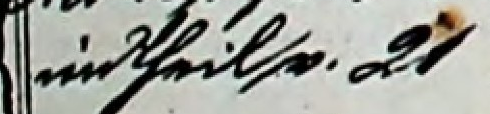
im Theil v. 21
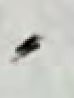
„
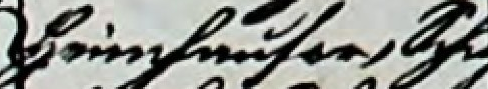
Heimhauser, Schaf„
